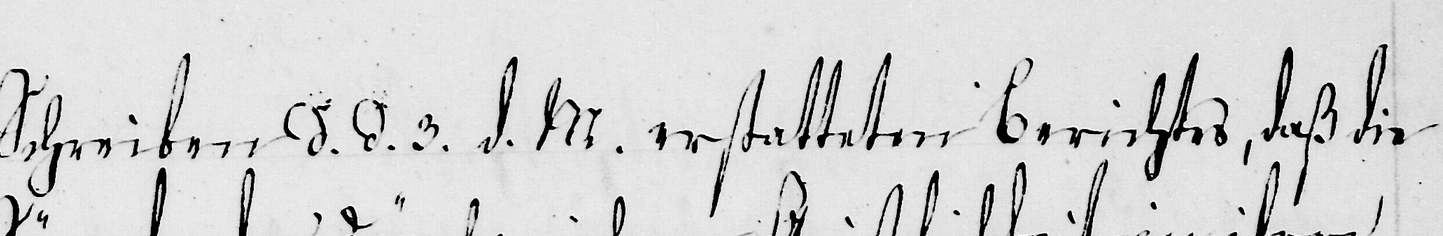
Schreiben d. d. 3. d. M. erstatteten Berichtes, daß die
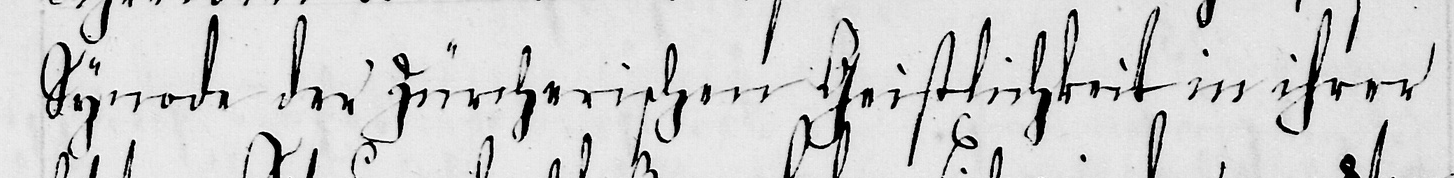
Synode der Zürcherischen Geistlichkeit in ihrer
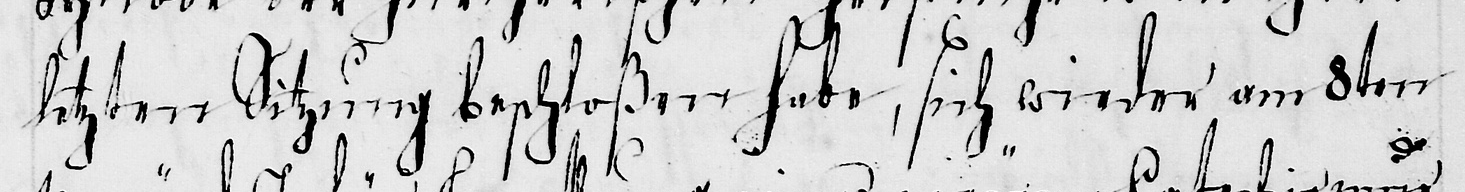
letzten Sitzung beschloßen habe, sich wieder am 8ten
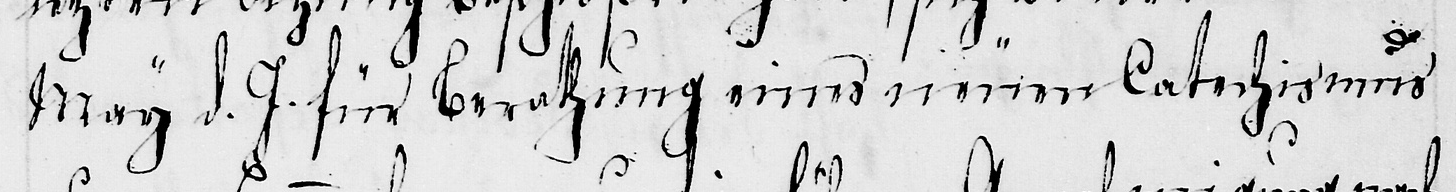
May d. J. für Berathung eines neuen Catechismus
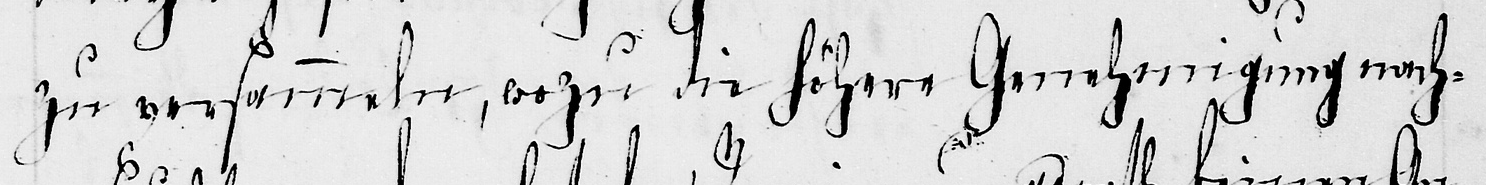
zu versammeln, wozu die Höhere Genehmigung nach¬
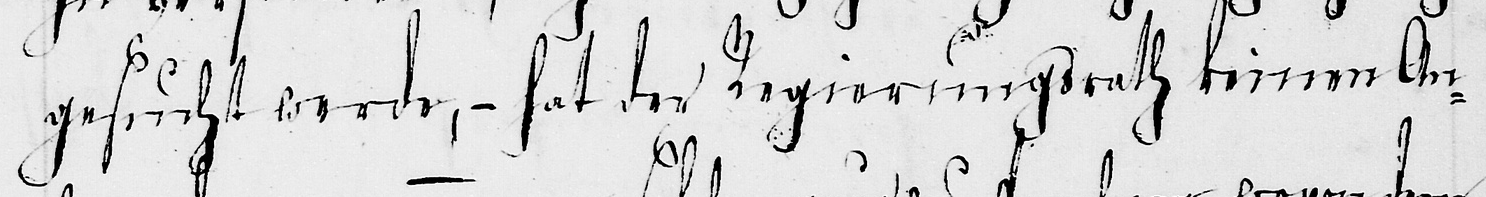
gesucht werde, – hat der Regierungsrath keinen An¬
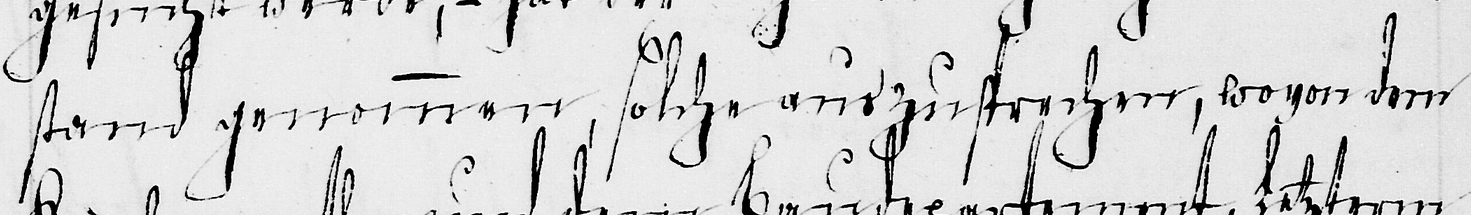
stand genommen, solche auszusprechen, wovon dem
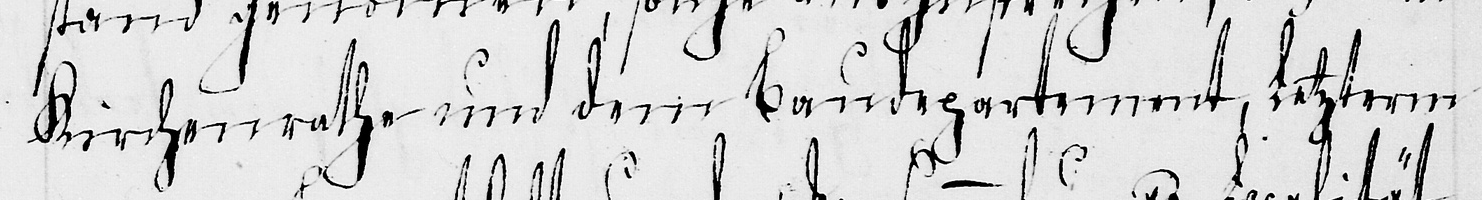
Kirchenrathe und dem Baudepartement, Letzterm
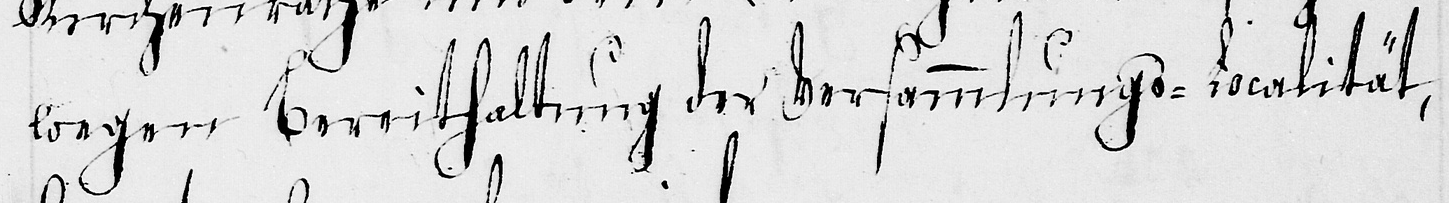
wegen Bereithaltung der Versammlungs-Localität,
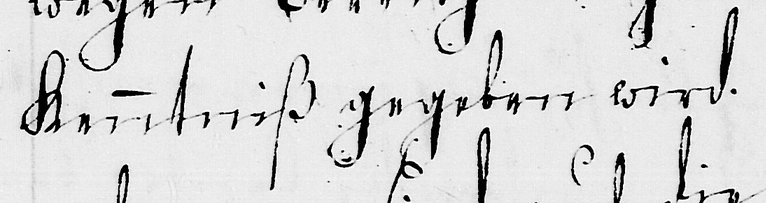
Kenntniß gegeben wird.
